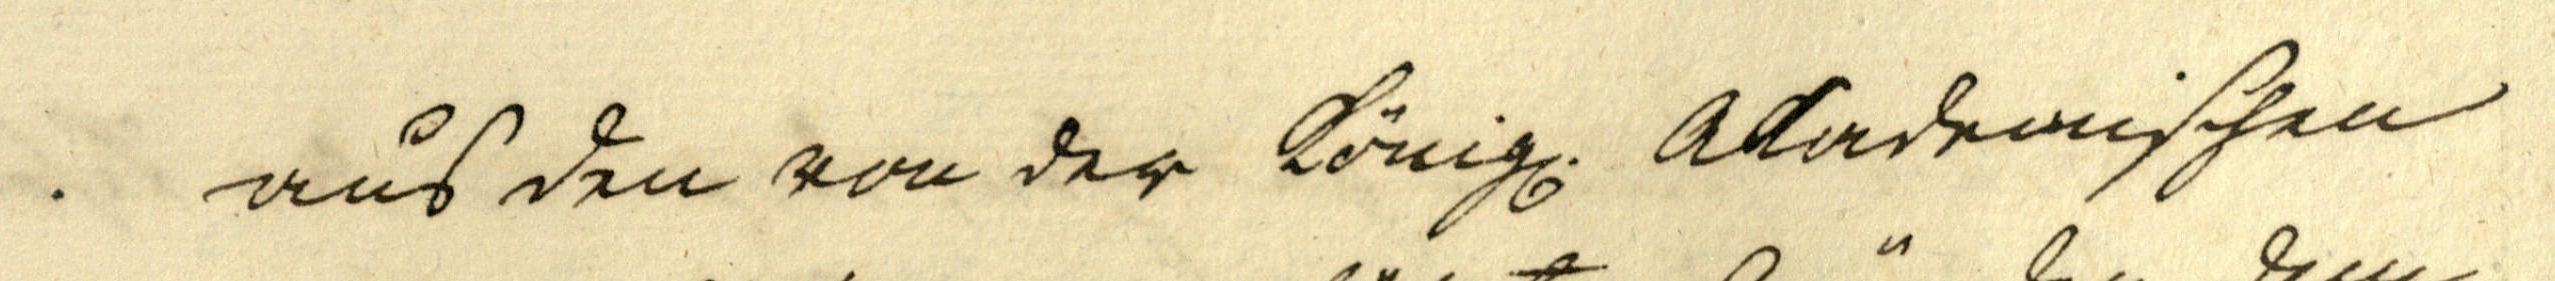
aus den von der Königl. Akademischen
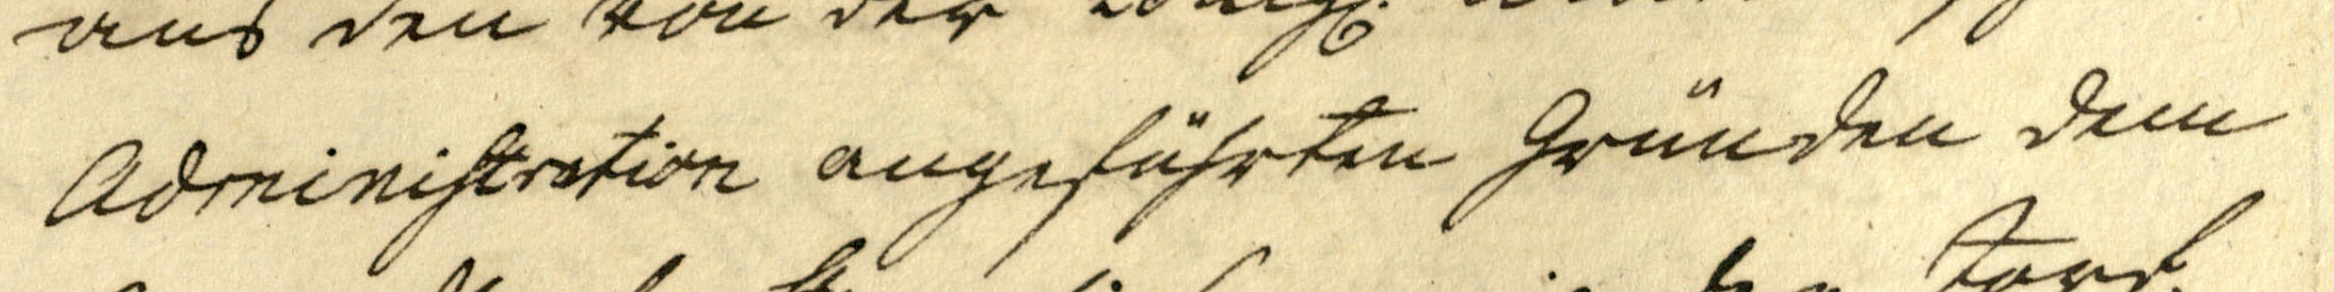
Administration angeführten Gründen dem
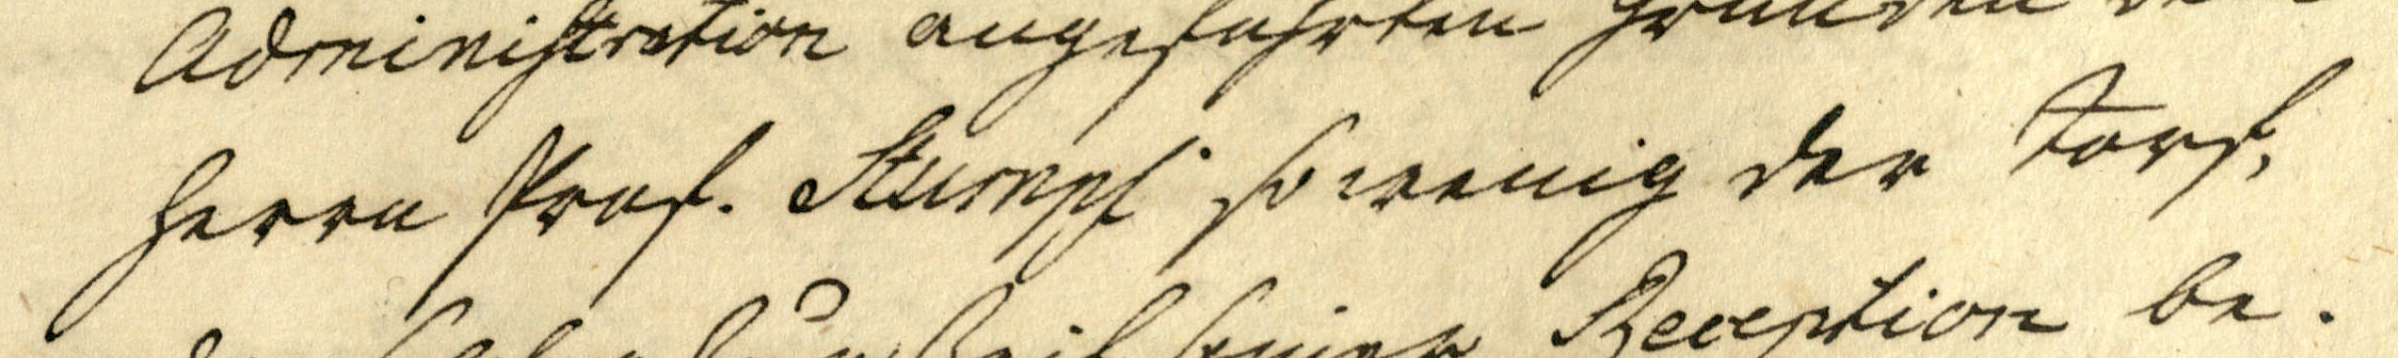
Herrn Prof. Stumpf so wenig der Torf,
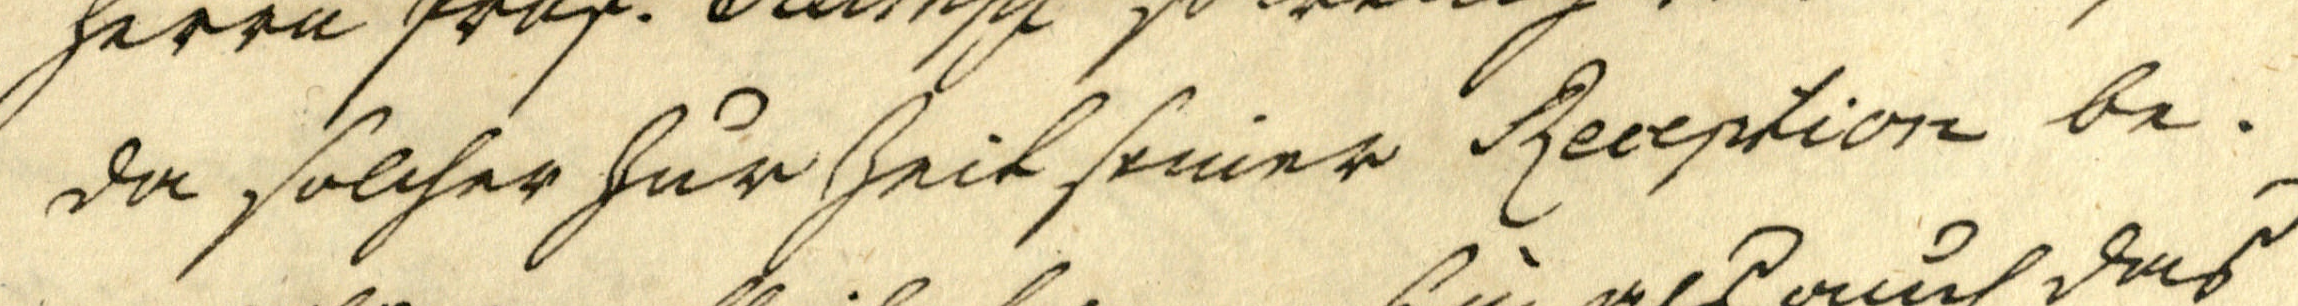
da solcher zur Zeit seiner Reception be¬
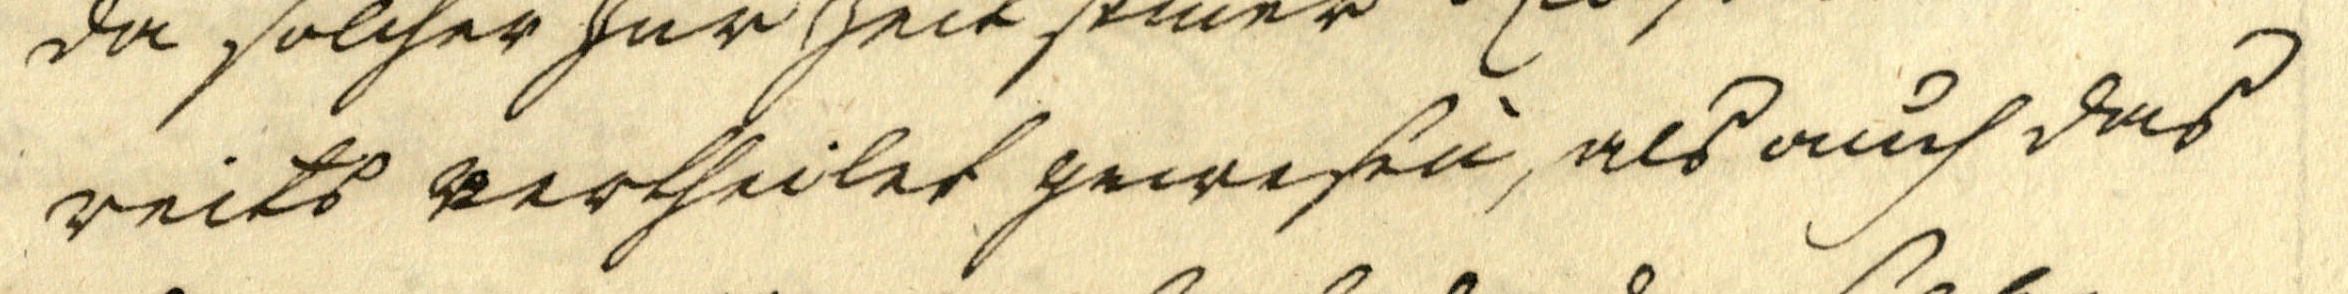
reits ertheilet gewesen, als auch das
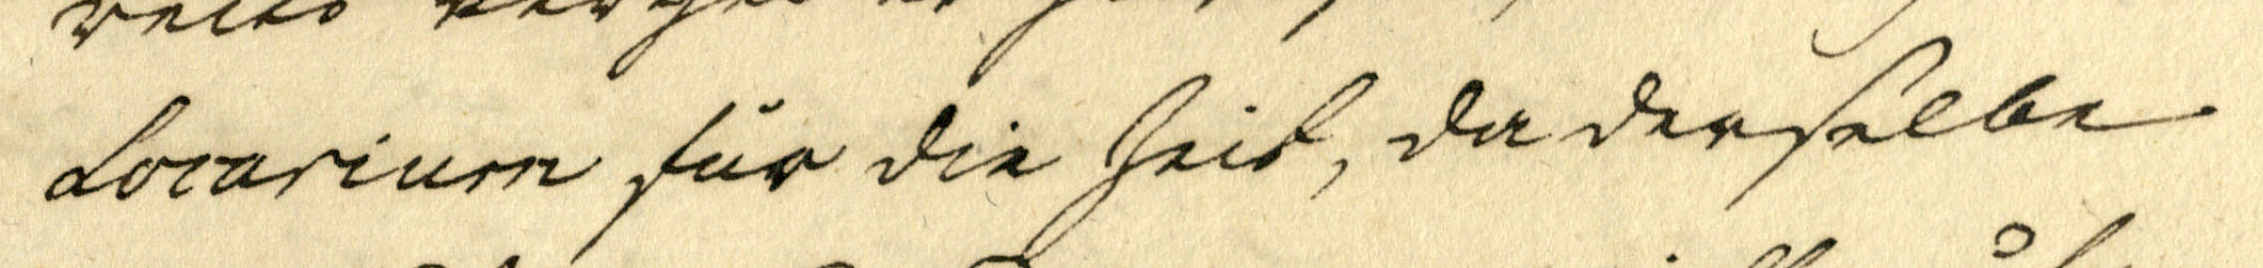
Locarium für die Zeit, da derselbe
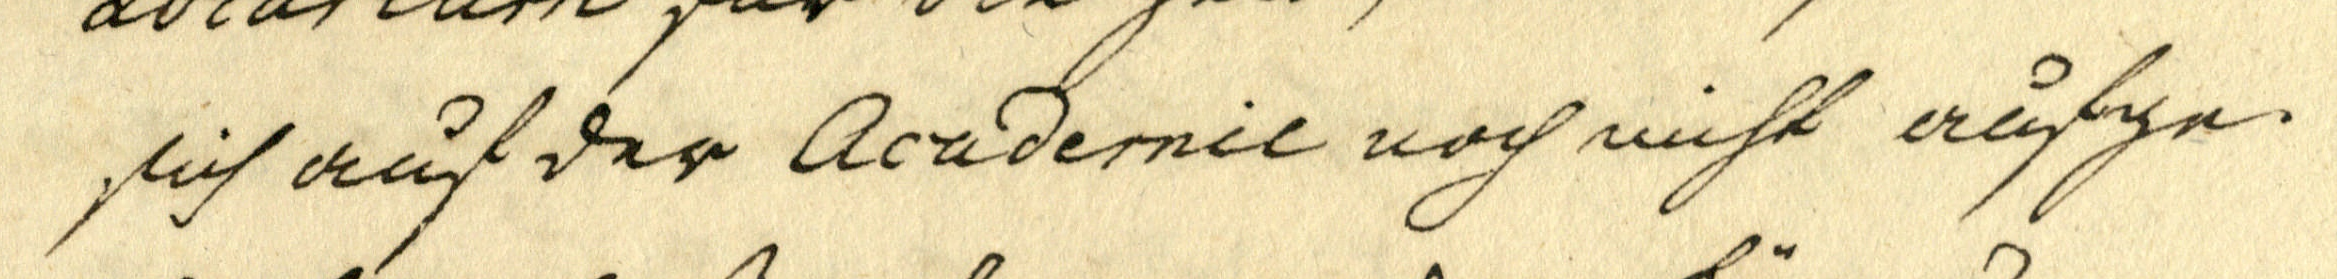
sich auf der Academie noch nicht aufge¬
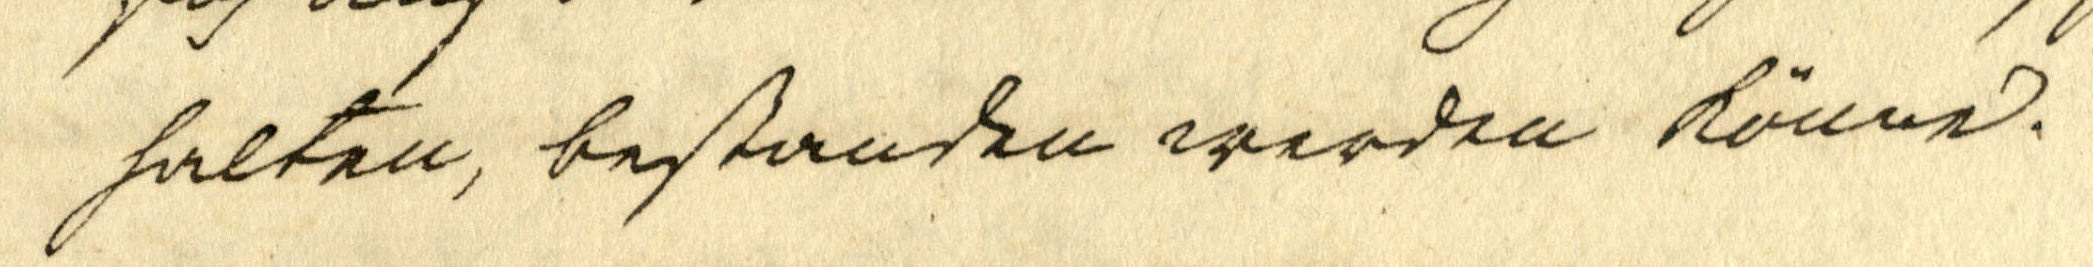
halten, bestanden werden könne.
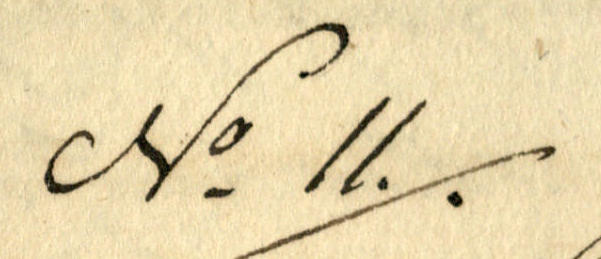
No. 11.
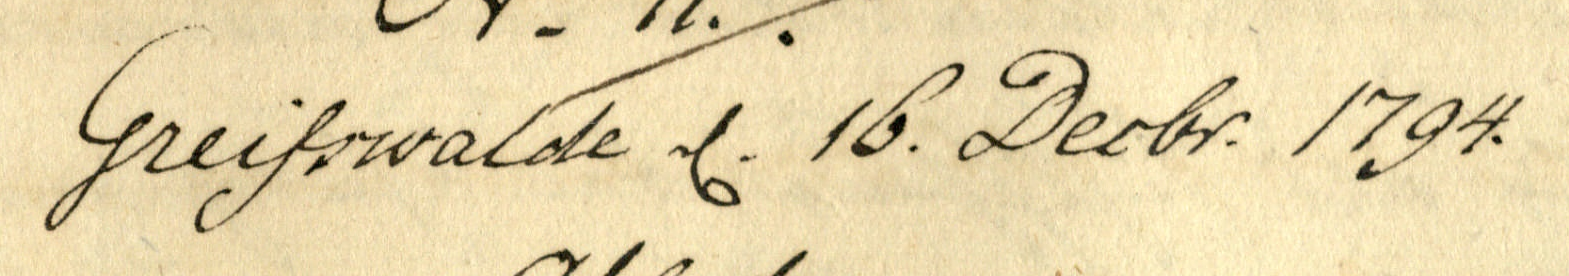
Greifswalde d. 16. Decbr. 1794
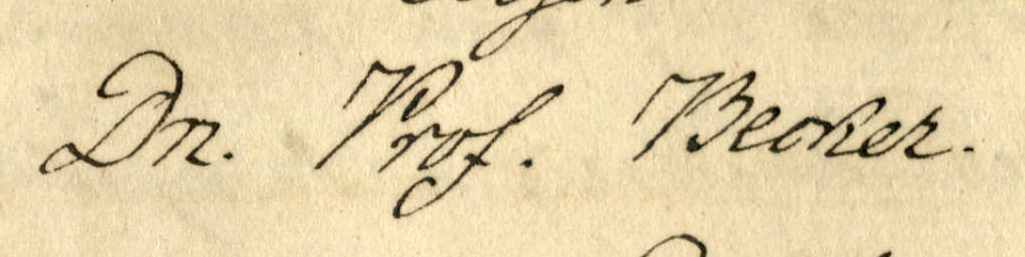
Dn. Prof. Becker.
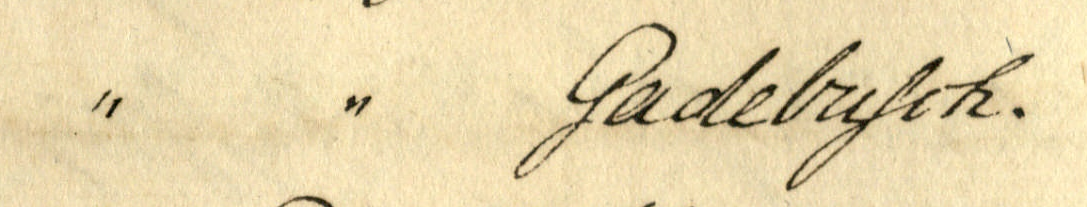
Gadebusch.
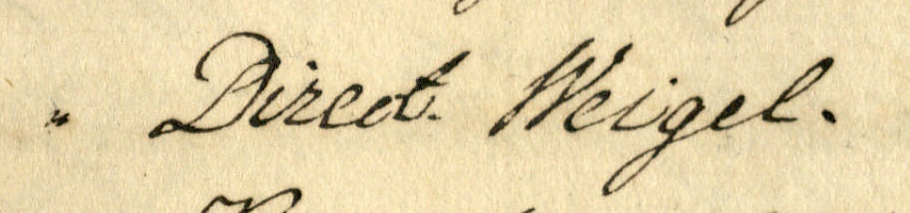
Direct. Weigel. ad 1.
